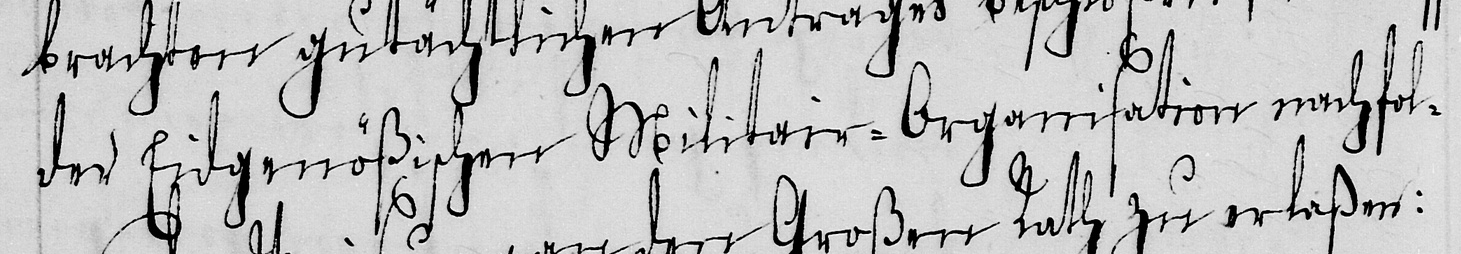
der Eidgenößischen Militair-Organisation nachfol¬
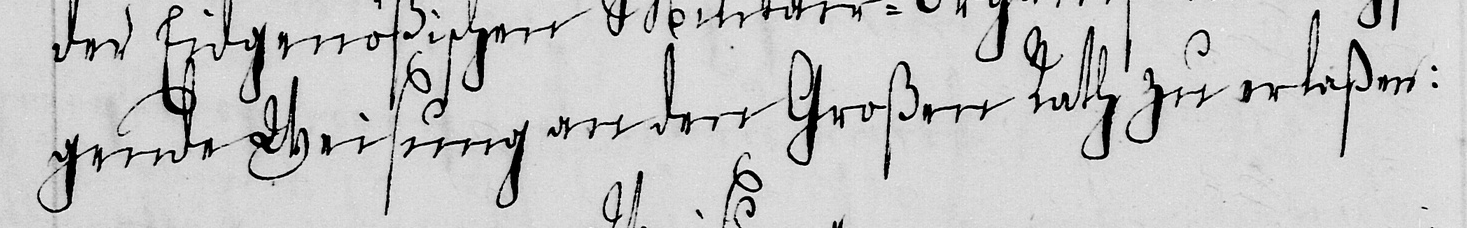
gende Weisung an den Großen Rath zu erlaßen:
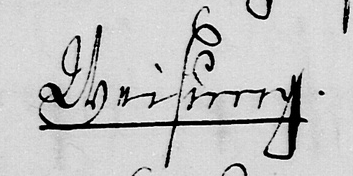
Weisung.
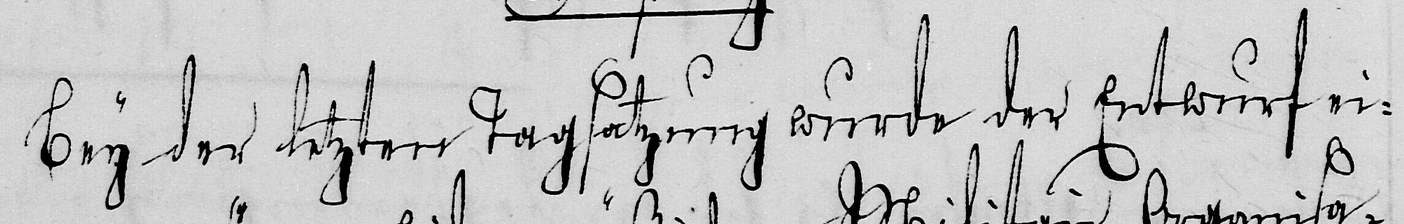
Bey der letzten Tagsatzung wurde der Entwurf ei¬
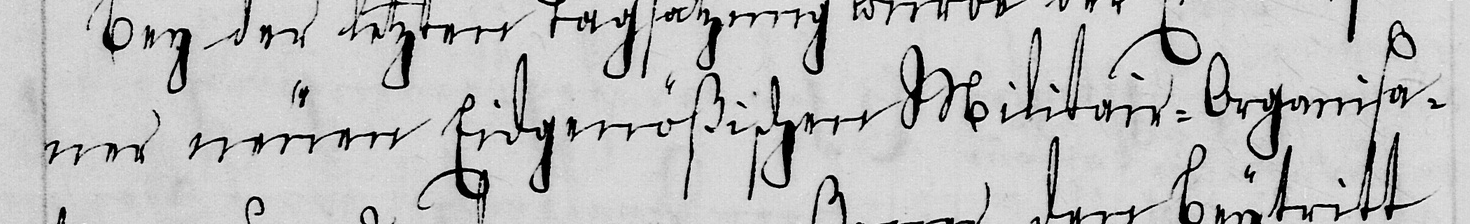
ner neuen Eidgenößischen Militair-Organisa¬
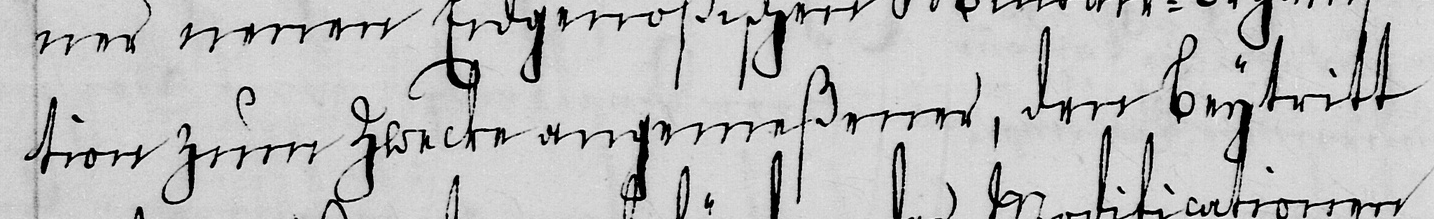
tion zum Zwecke angemeßener, den Beytritt
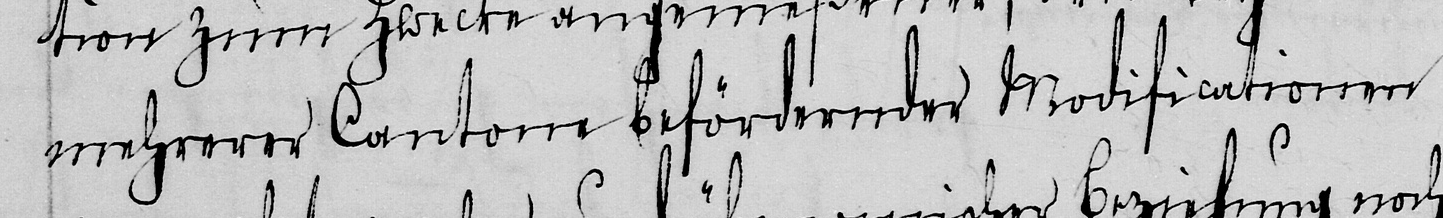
mehrerer Cantone befördernder Modificationen
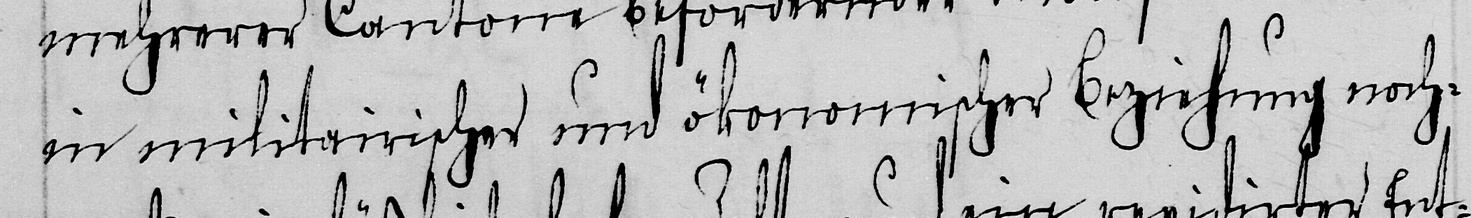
in militairischer und ökonomischer Beziehung noch¬
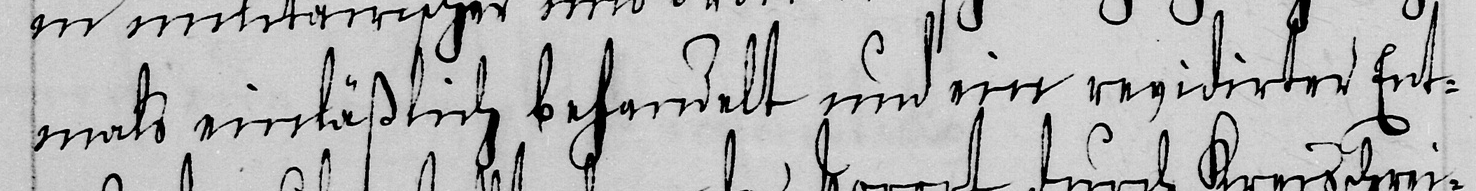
mals einläßlich behandelt und ein revidirter Ent¬
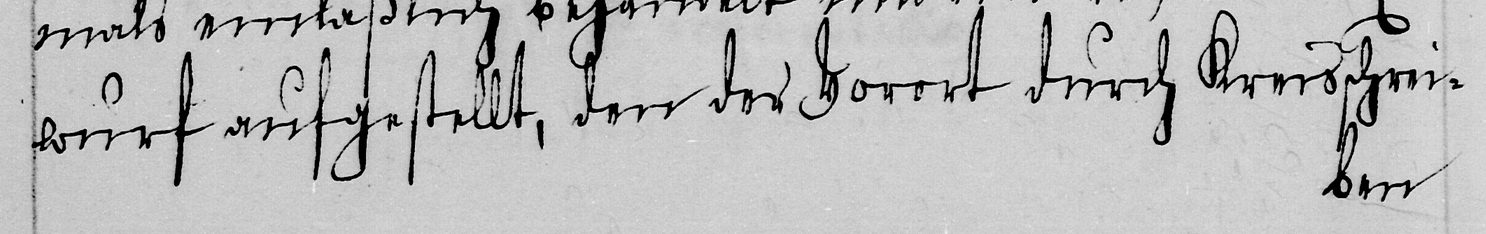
wurf aufgestellt, den der Vorort durch Kreisschrei-
